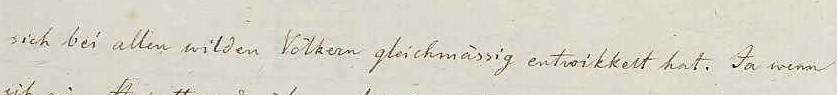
sich bei allen wilden Völkern gleichmässig entwikkelt hat. Ja wenn
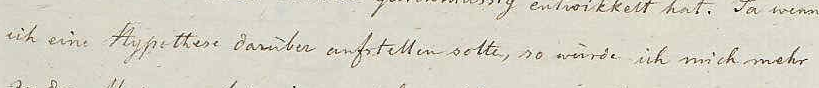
ich eine Hypothese darüber aufstellen solte, so würde ich mich mehr
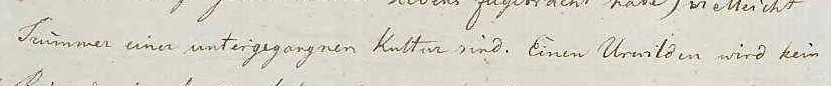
Trümmer einer untergegangnen Kultur sind. Einen Urwilden wird kein
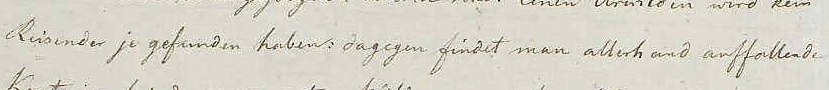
Reisender je gefunden haben: dagegen findet man allerhand auffallende
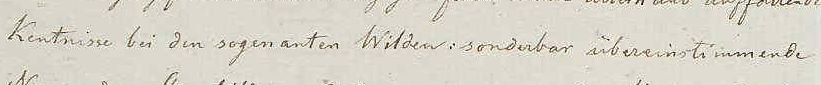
Kentnisse bei den sogenanten Wilden: sonderbar übereinstimmende
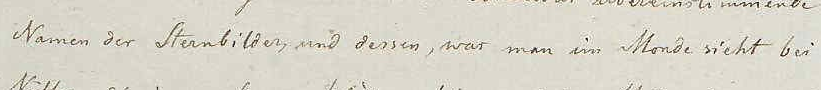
Namen der Sternbilder, und dessen, was man im Monde sieht bei
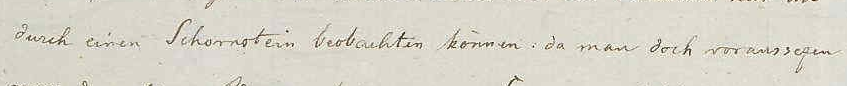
durch einen Schornstein beobachten können: da man doch voraussezen
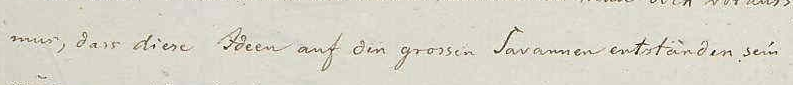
mus, dass diese Ideen auf den grossen Savannen entständen sein
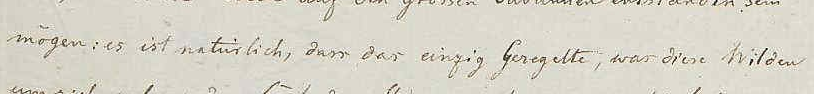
mögen: es ist natürlich, dass das einzig Geregelte, was diese Wilden
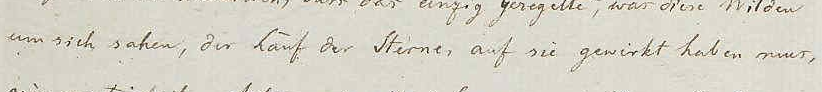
um sich sahen, der Lauf der Sterne, auf sie gewirkt haben mus,
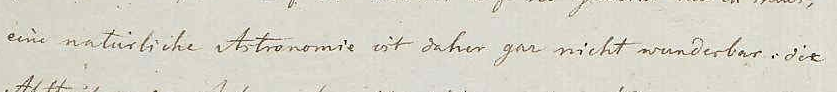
eine natürliche Astronomie ist daher gar nicht wunderbar: derdie
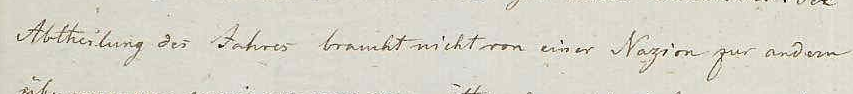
Abtheilung des Jahres braucht nicht von einer Nazion zur andern
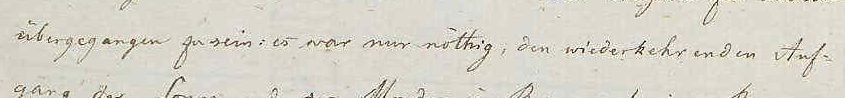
übergegangen zu sein: es war nur nöthig, den wiederkehrenden Auf-
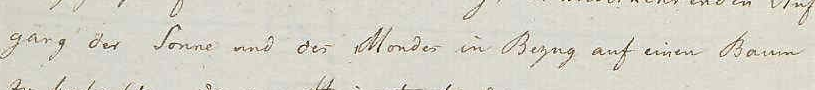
gang der Sonne und des Mondes in Bezug auf einen Baum
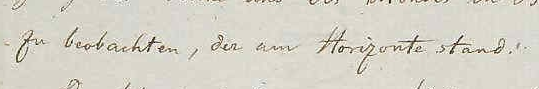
zu beobachten, der am Horizonte stand.
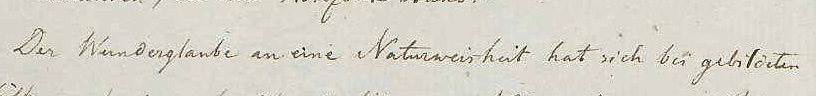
Der Wunderglaube an eine Naturweisheit hat sich bei gebildeten
